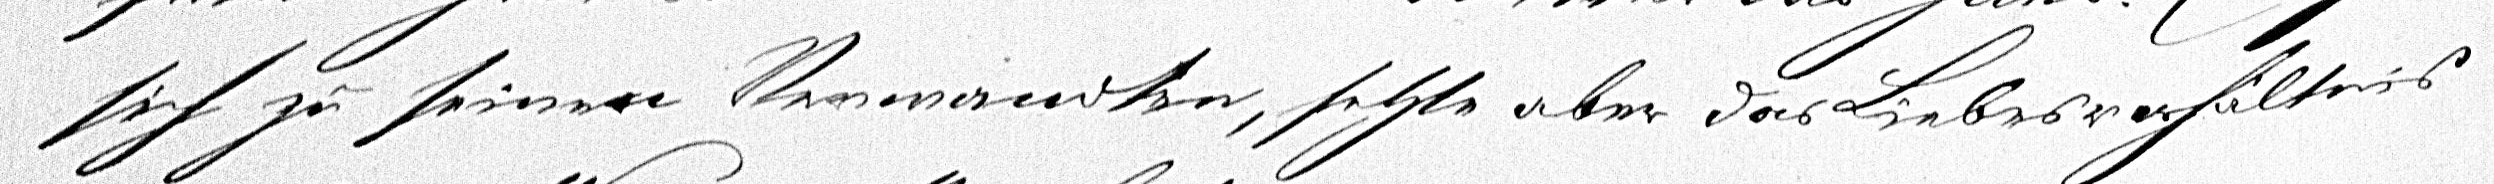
sich zu seinen Verwandten, setzte aber das Liebesverhältnis
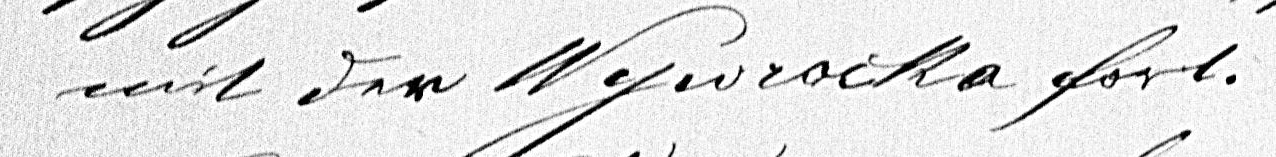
mit der Wywrocka fort.
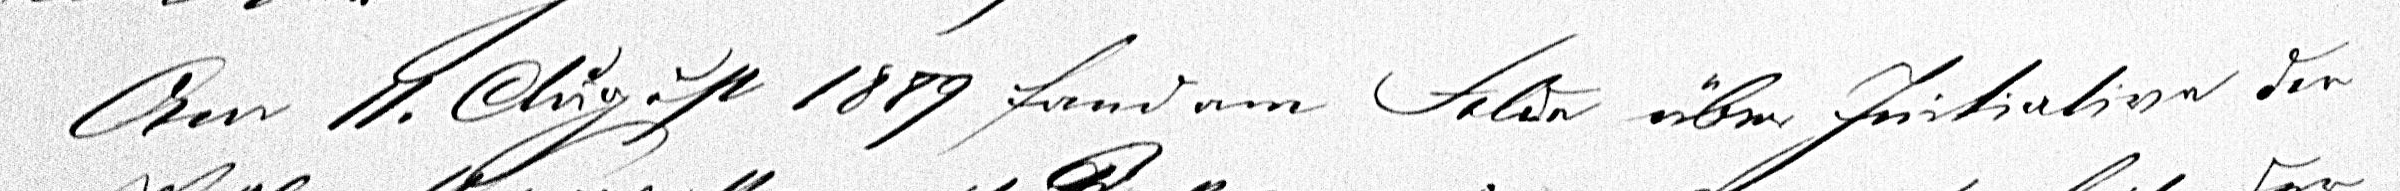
Am 11. August 1889 fand am Felde über Initiative der
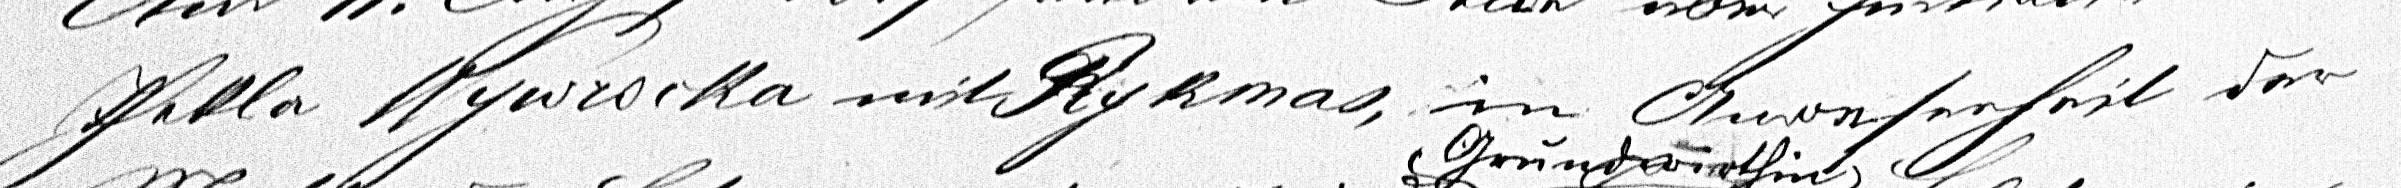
Thekla Wywrocka mit Rykmas, in Anwesenheit der
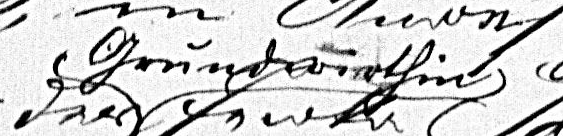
Grundwirthin
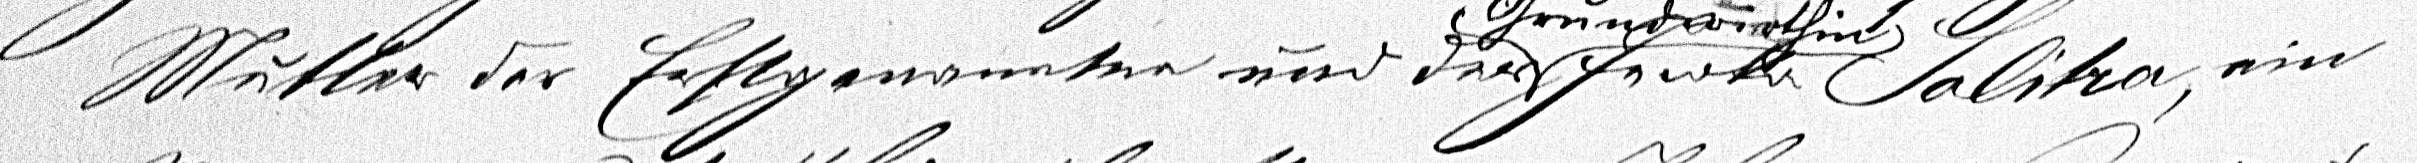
Mutter der Erstgenannten und der xxkaSolitra, ein
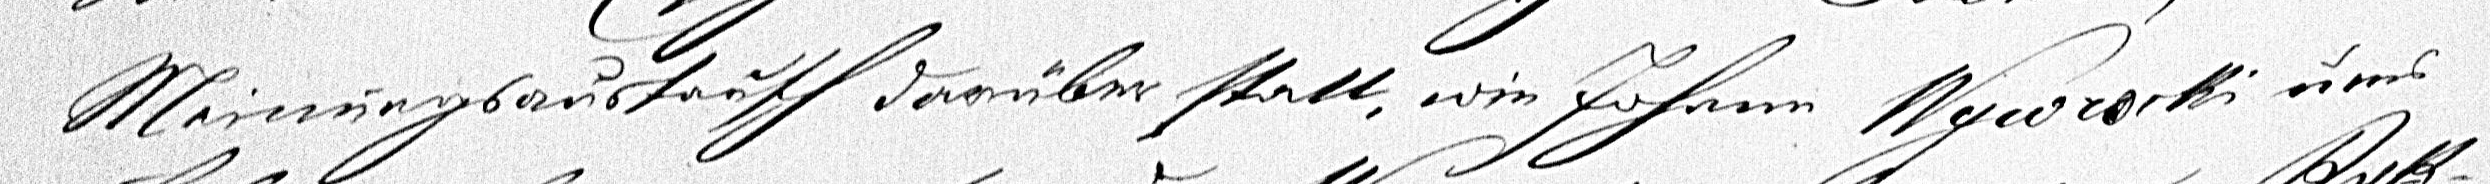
Meinungsaustausch darüber statt, wie JohannWywrocki ums
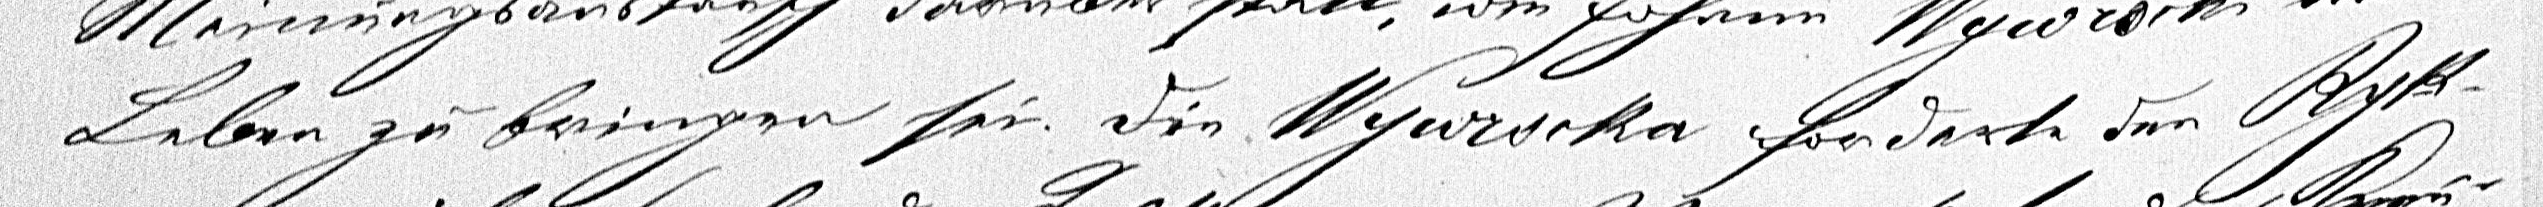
Leben zu bringen sei.Die Wywrocka forderte den Ryk¬
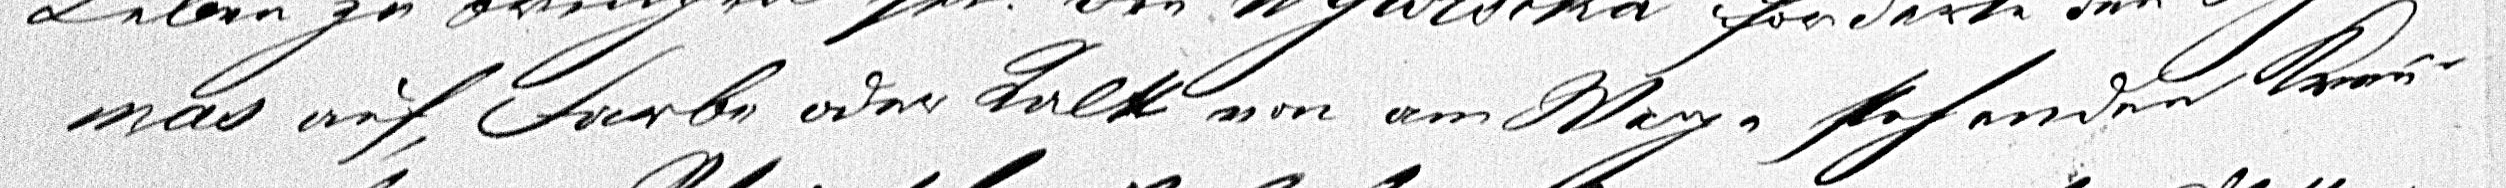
mas auf, Farbe oder LKalk von am Wege stehenden Kreu¬
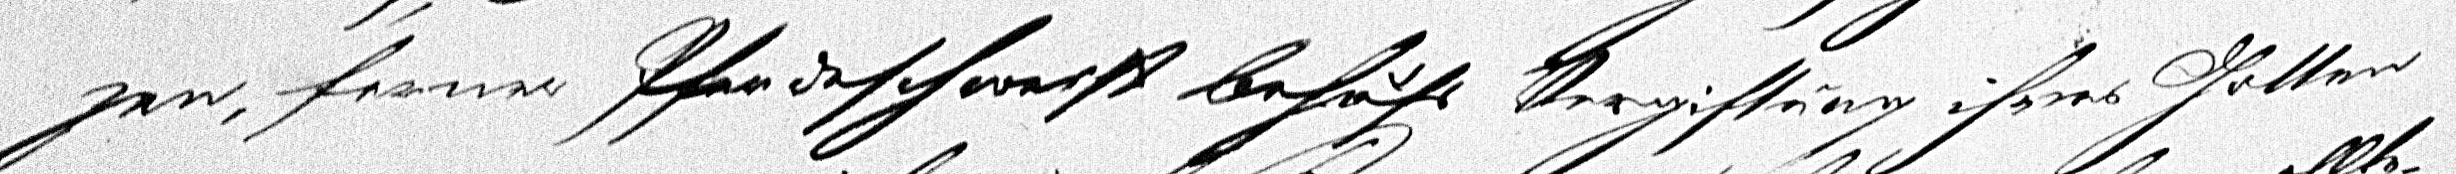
zen, ferner Pferdeschwerst behufs Vergiftung ihres Gatten
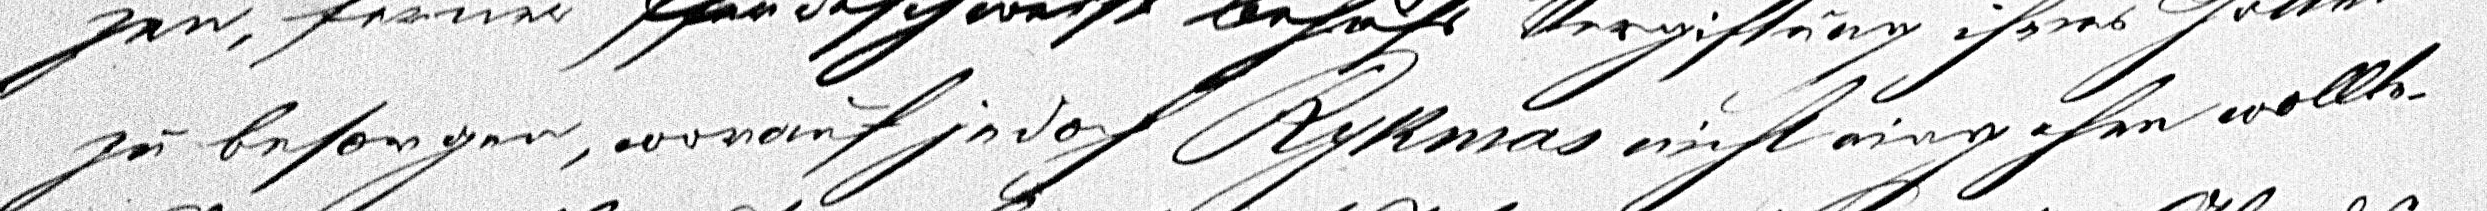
zu besorgen, worauf jedoch Rykmas nichteingehen wollte.
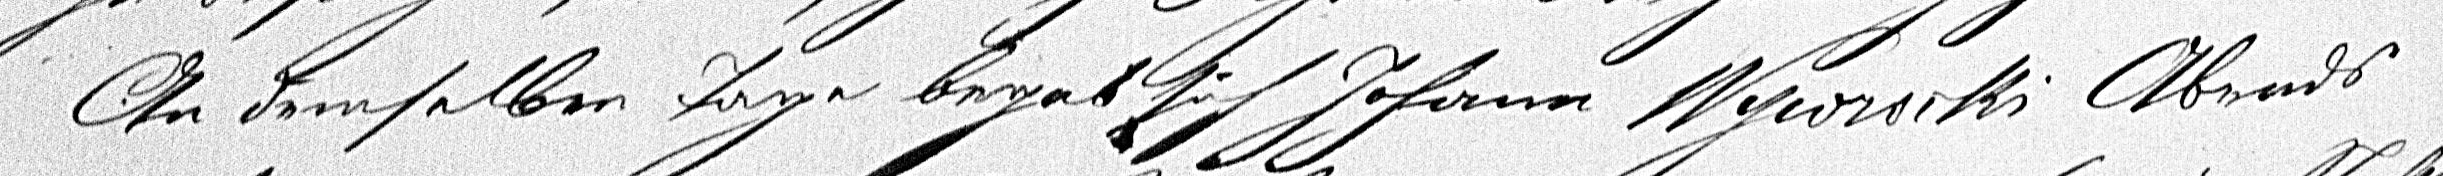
An demselben Tage begab sich Johann Wywrocki Abends
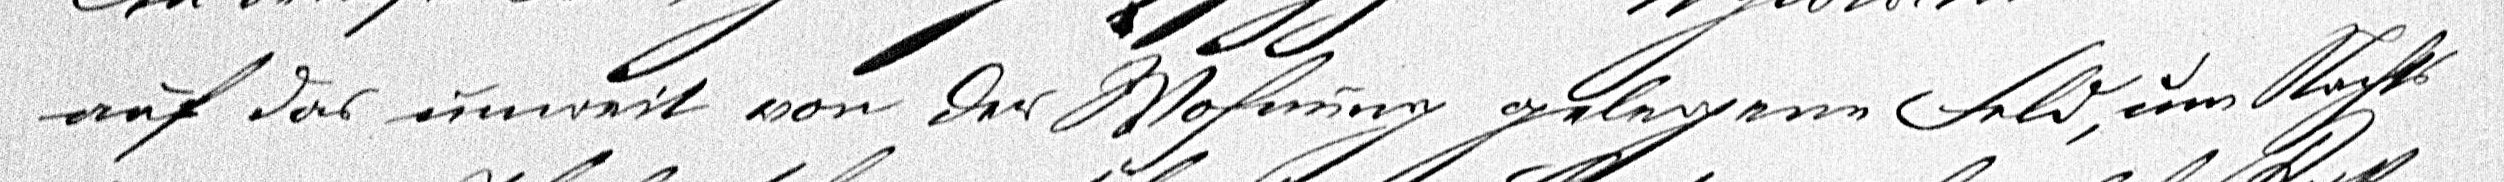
auf das unweit von der Wohnung gelegene Feld, um Nachts
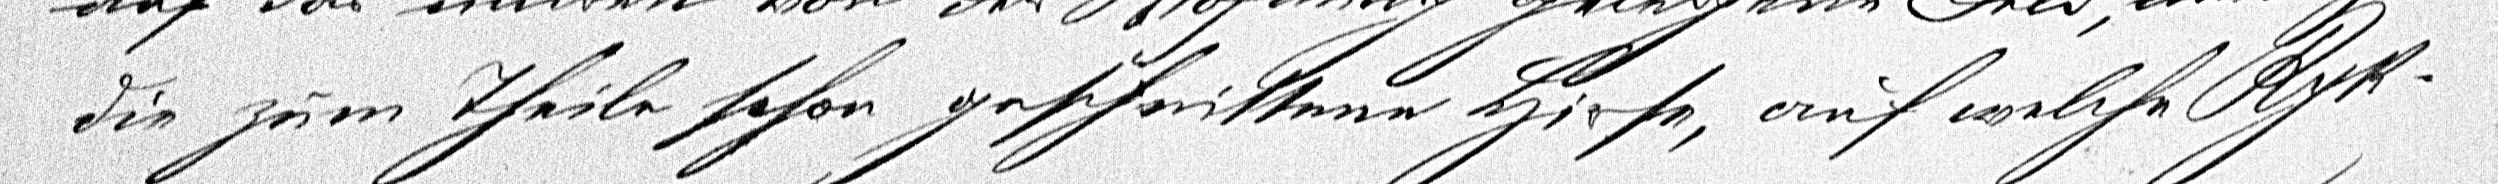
die zum Theile schon geschrittene Hirse, auf welche Ryk¬
